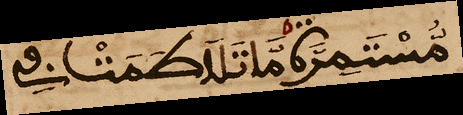مستمرة ما تلاطمت في
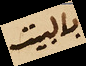بالبيت
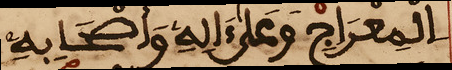المعراج وعلى ءاله وأصحابه
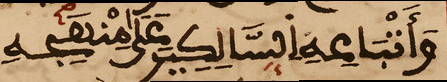وأتباعه السالكين على منهجه
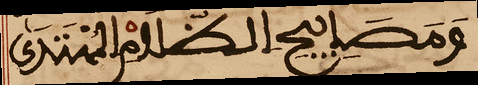ومصابيح الظلام المهتدي
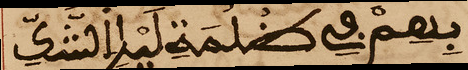بهم في ظلمة ليل الشك
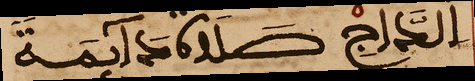الداج صلاة دآئمة
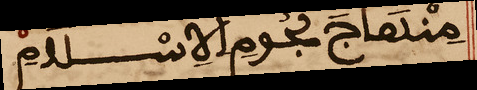منهاج نجوم الاسلام
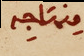منهاجه
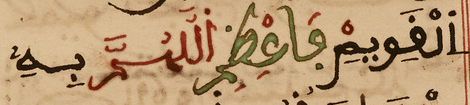القويم فاعظم اللهم به
